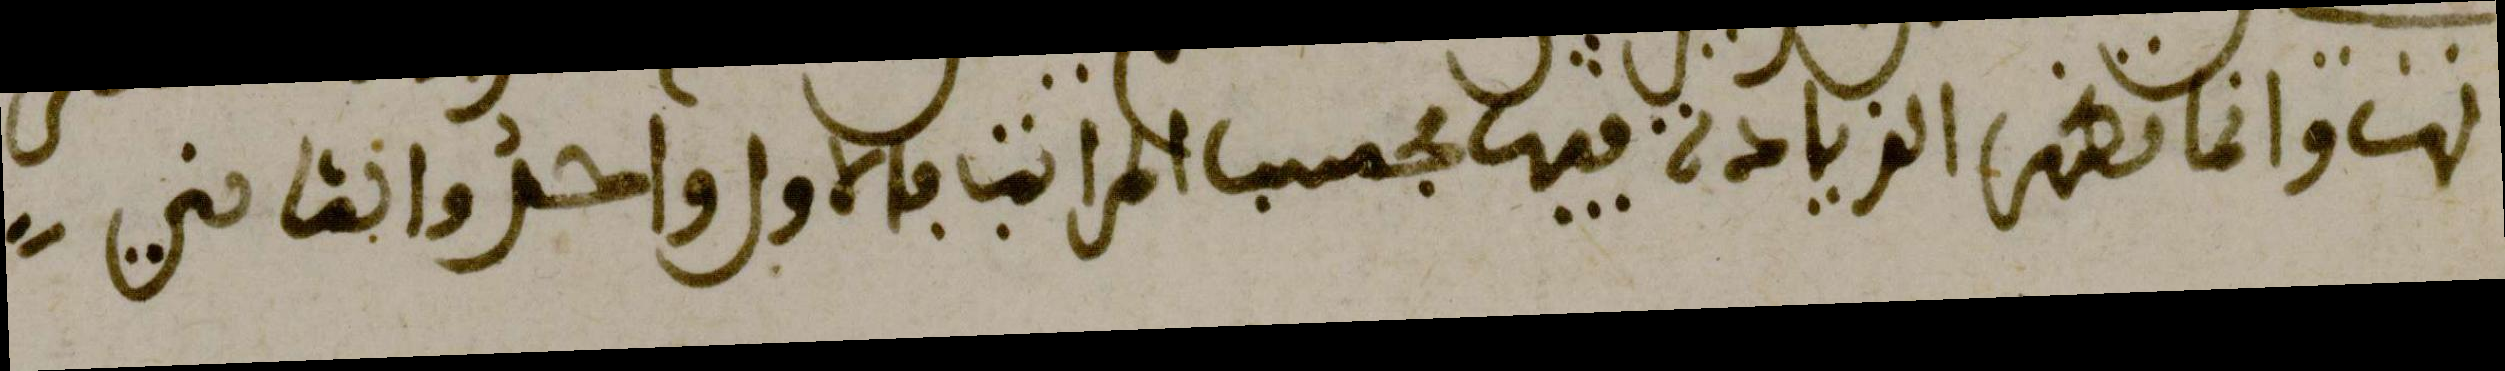لها وانما تظهر الزيادة فيهم بحسب المراتب فالاول واحد والثاني
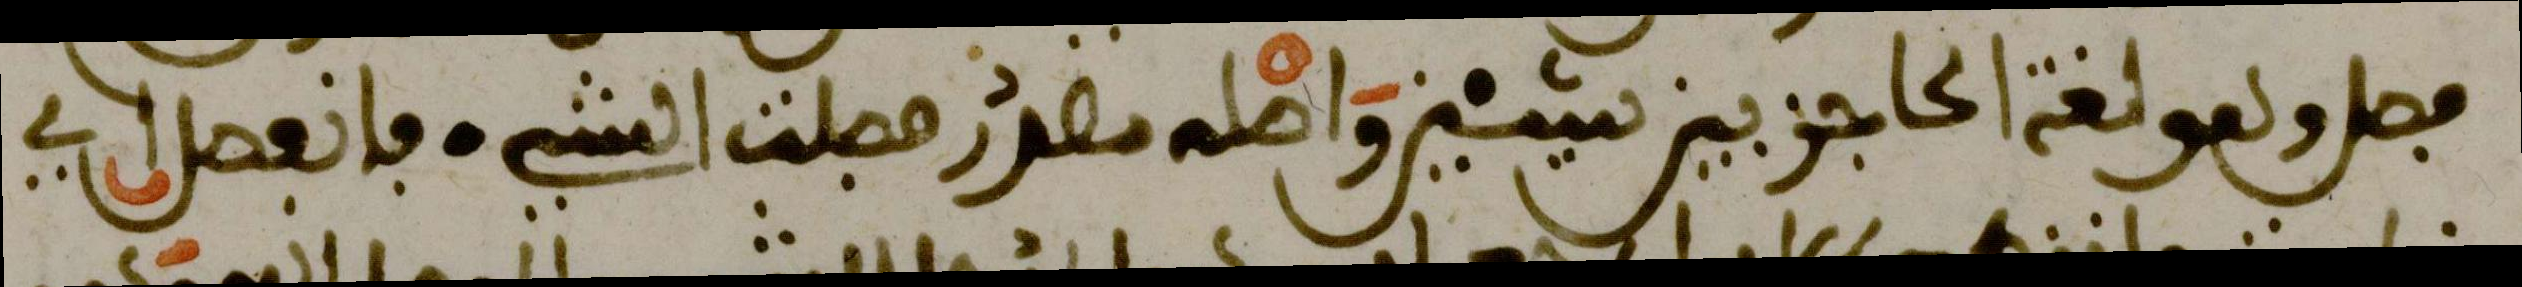فصل وهو لغة الحاجز بين شيئين وَاصْله مصدر فصلت الشيء فانفصل اي
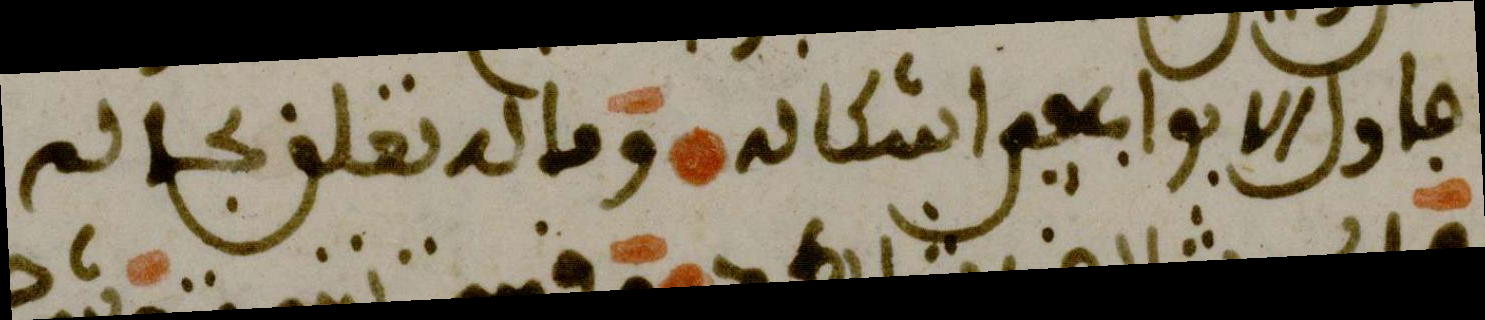فاول الابواب في اشكاله وَماله تعلق بحاله
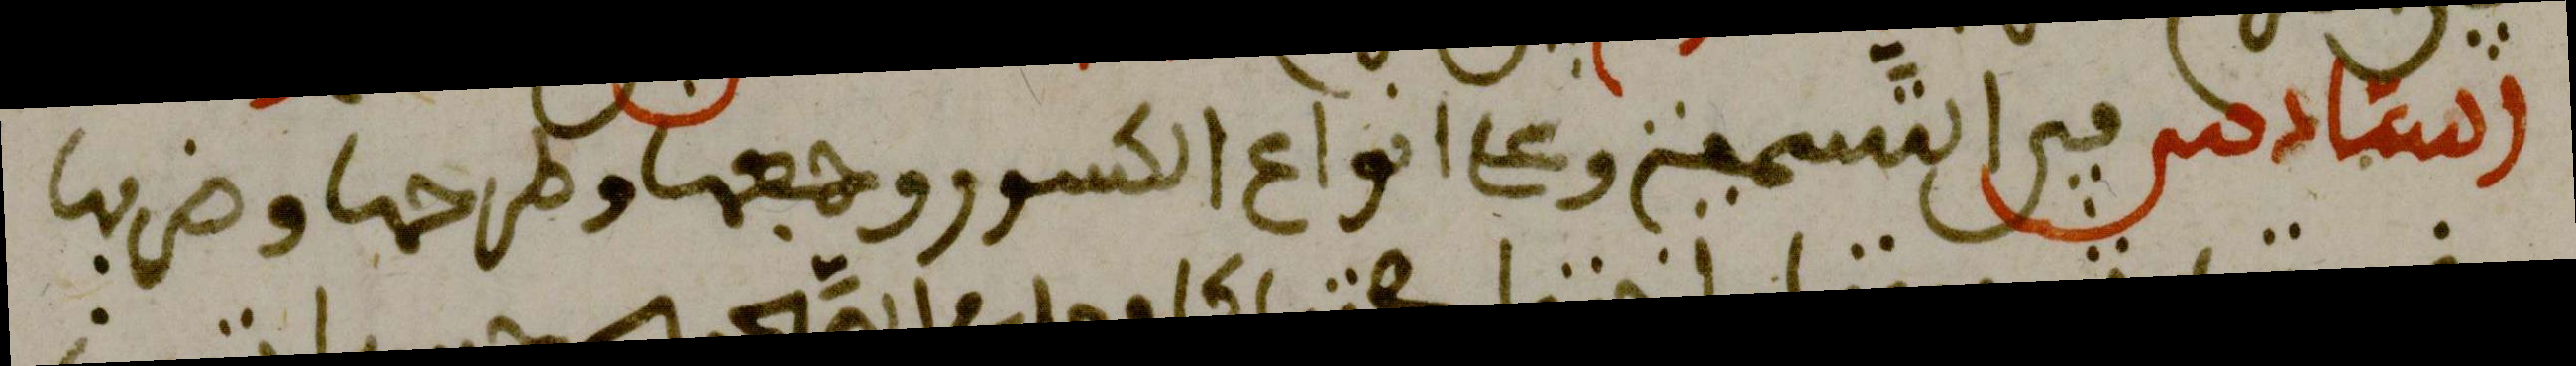السادس في التّسمية وعلى انواع الكسور وجمعها وطرحها وضربها
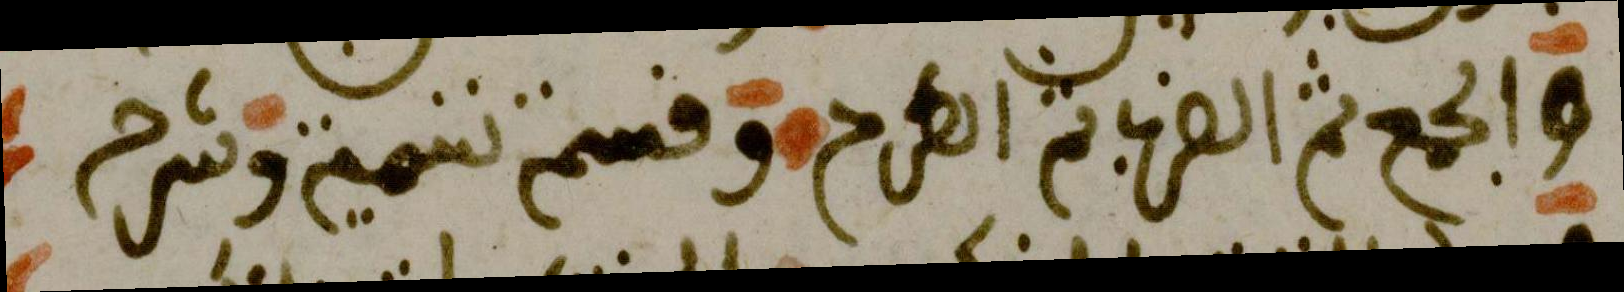وَالجمع ثم الضرب ثم الطرح وقسمة تسمية وشرح
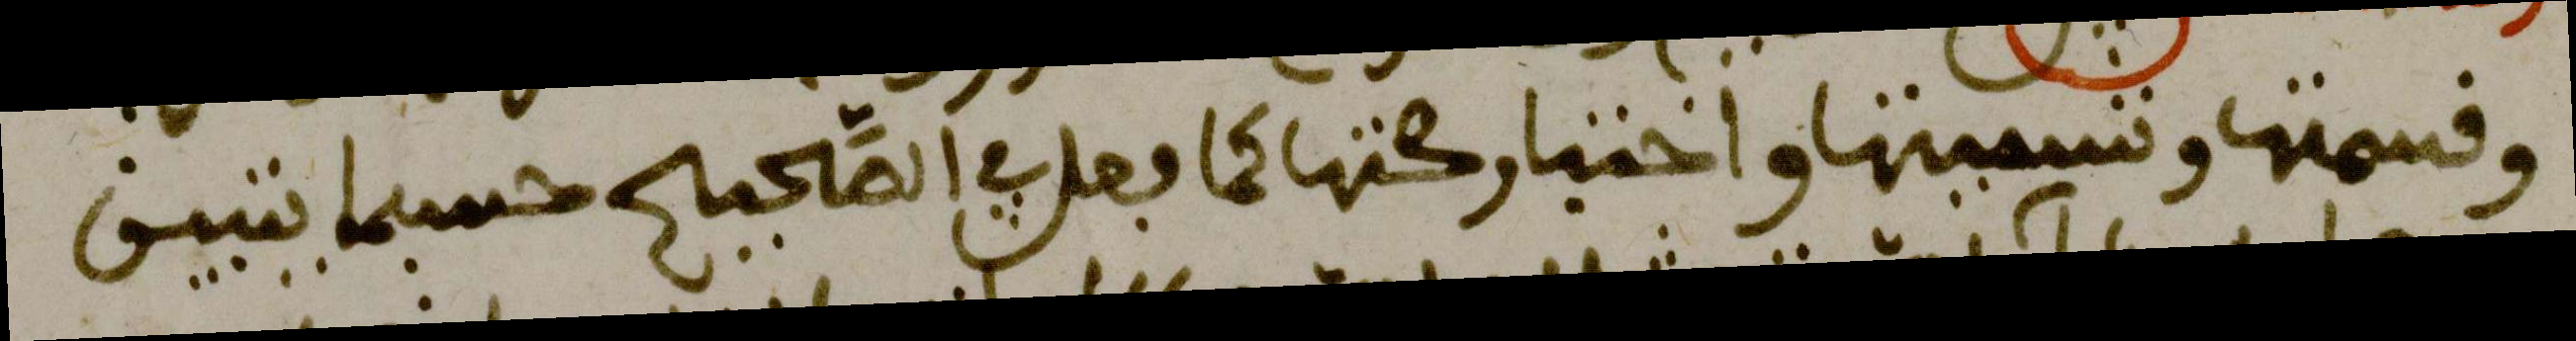وقسمتها وتسميتها واختبار صحتها كما فعل في الصّحيح حسبما يتبين
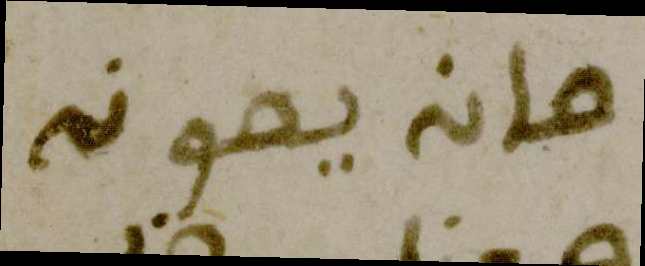صانه يصونه
